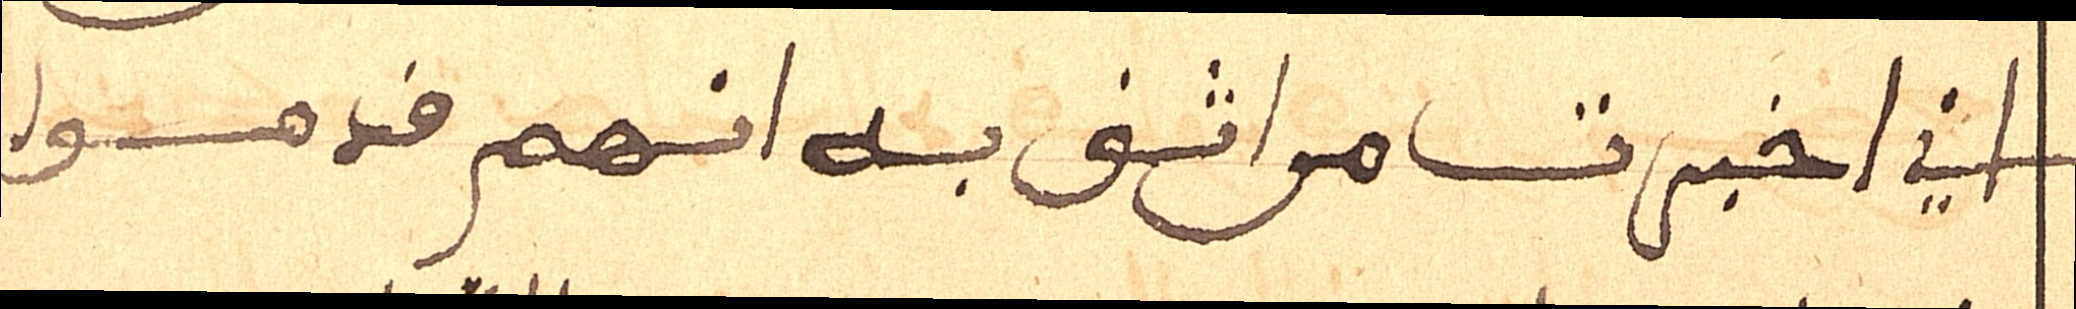اني خبرت من اثق به انهم قدموا
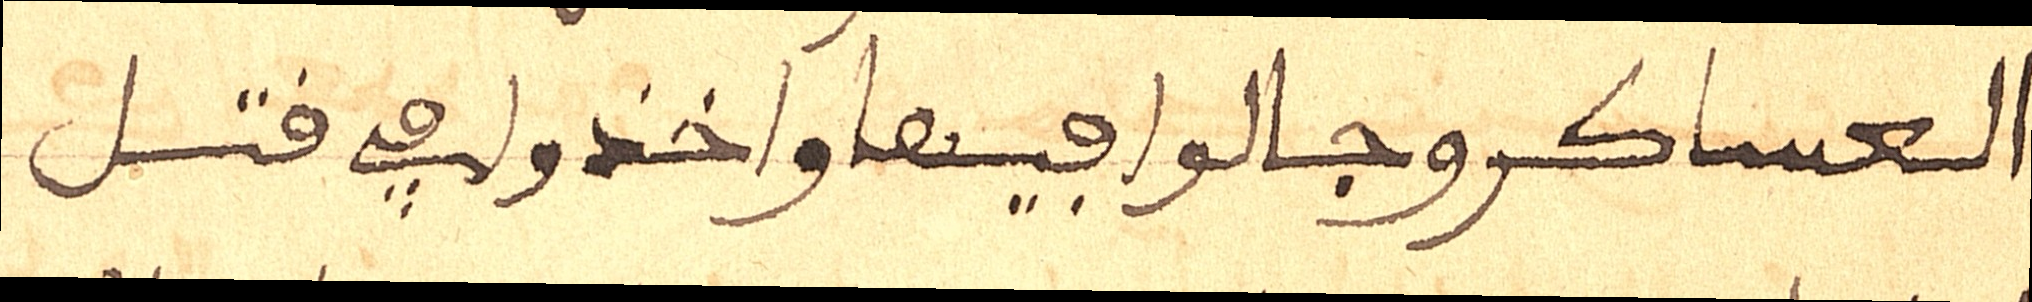العساكر وجالوا فيها واخذوا في قتل
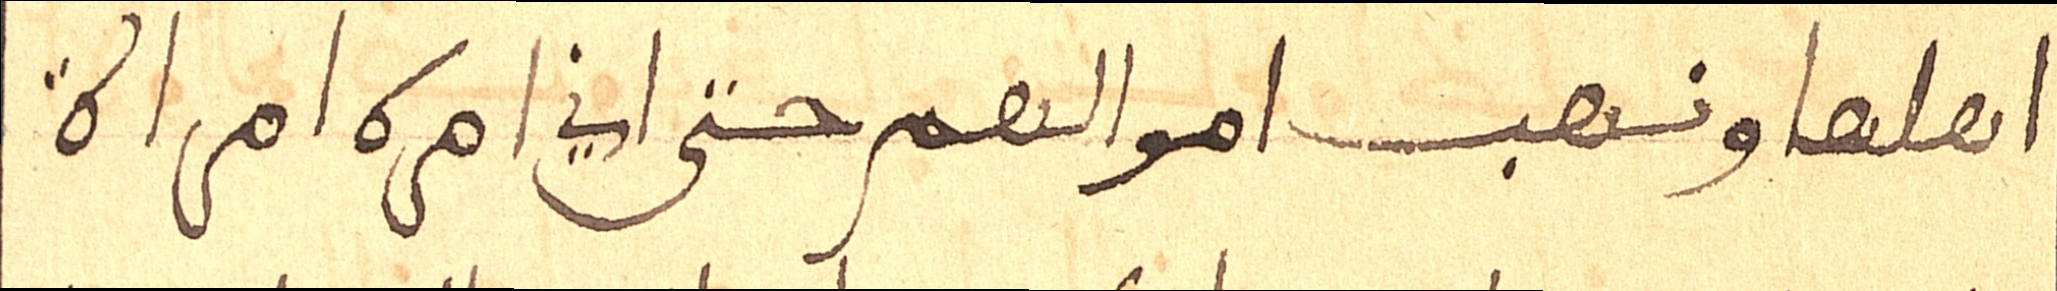اهلها ونهب اموالهم حتى اني امره امراة
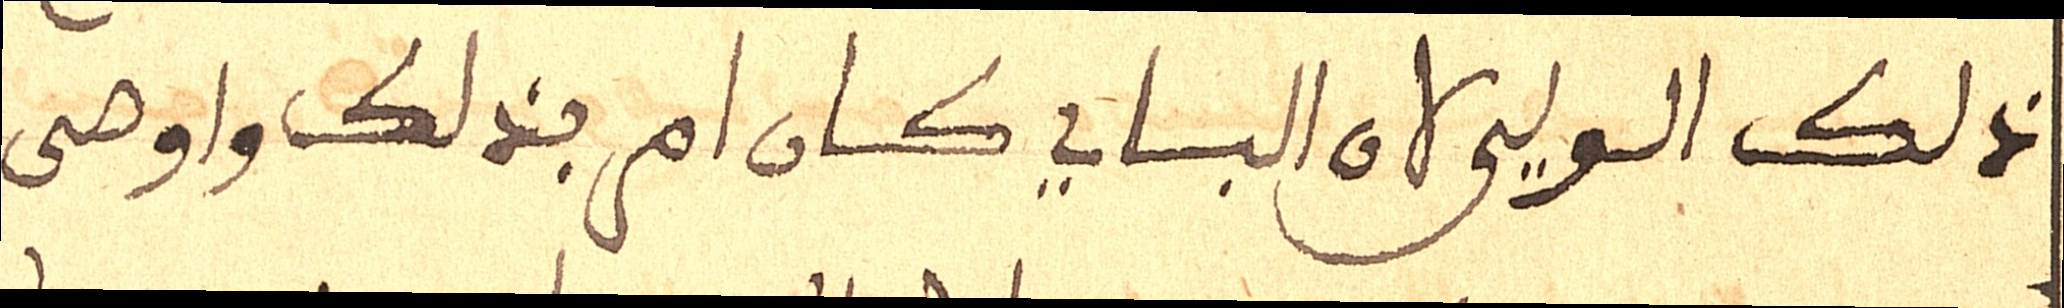ذلك الولي لان الباي كان امر بذلك وأوصى
